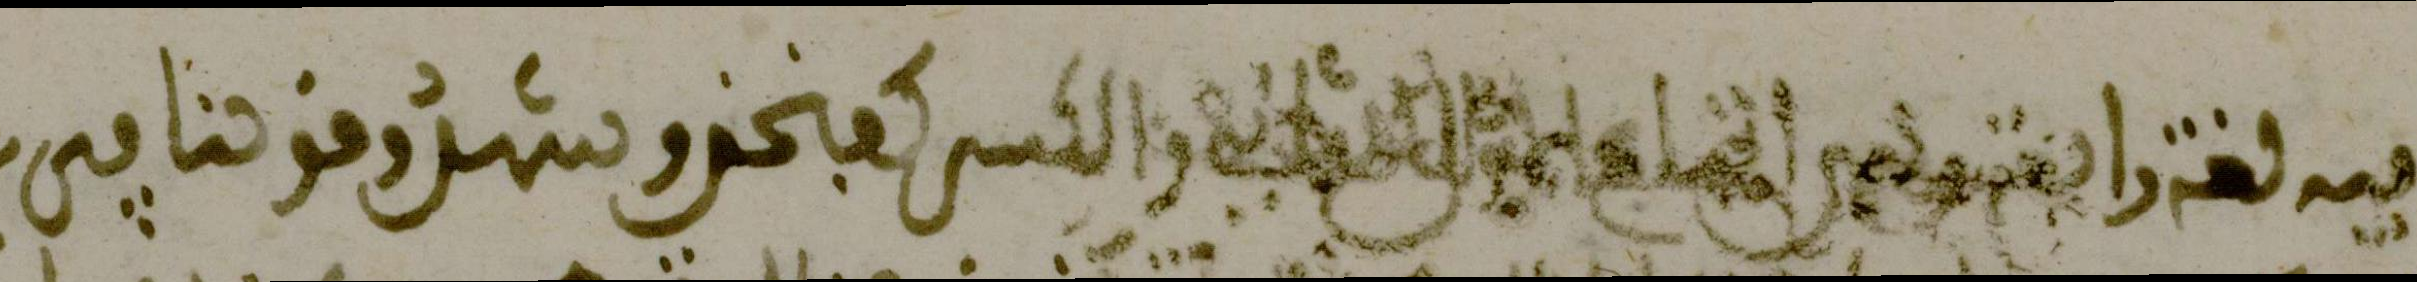فيه لغة وهي اتباع الاوّل للثاني في الكسر كفخذ وشهد وقولنا في
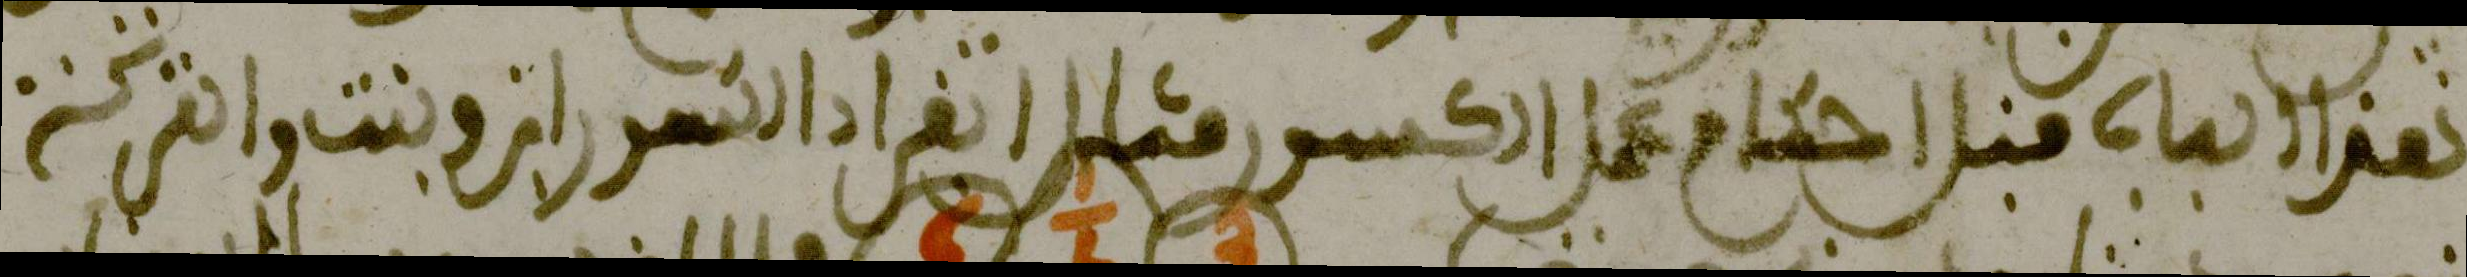هذا الباب قبل احكام عمل الكسور مثال انقراد الكسور ابن وبنت والتركة
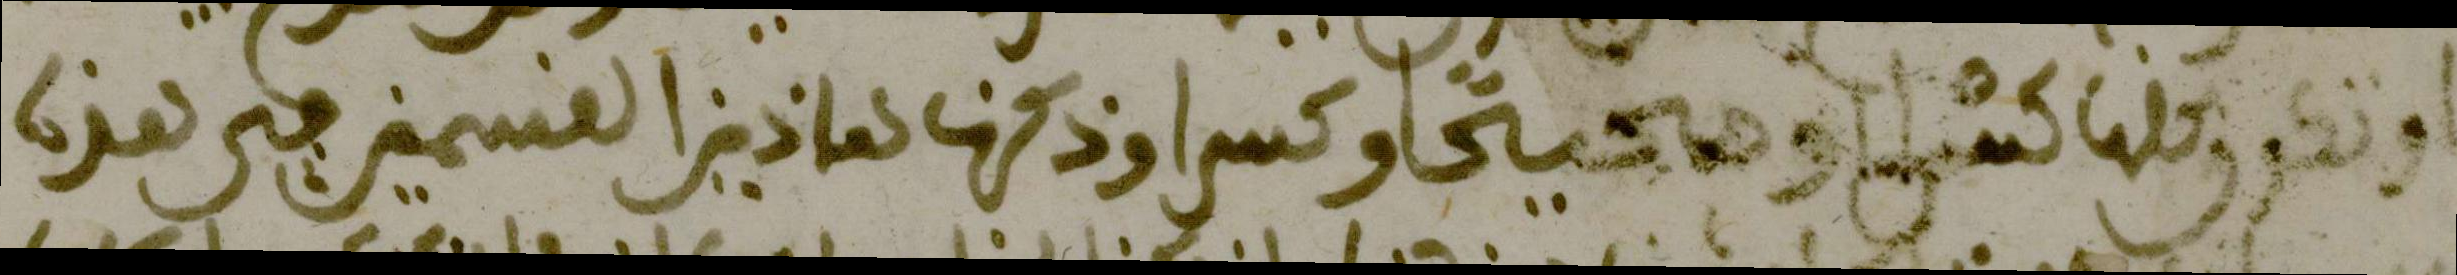او تكون كلها كسْور او صحيحًا وكسرا وذكرن هاذين القسميين في هذه
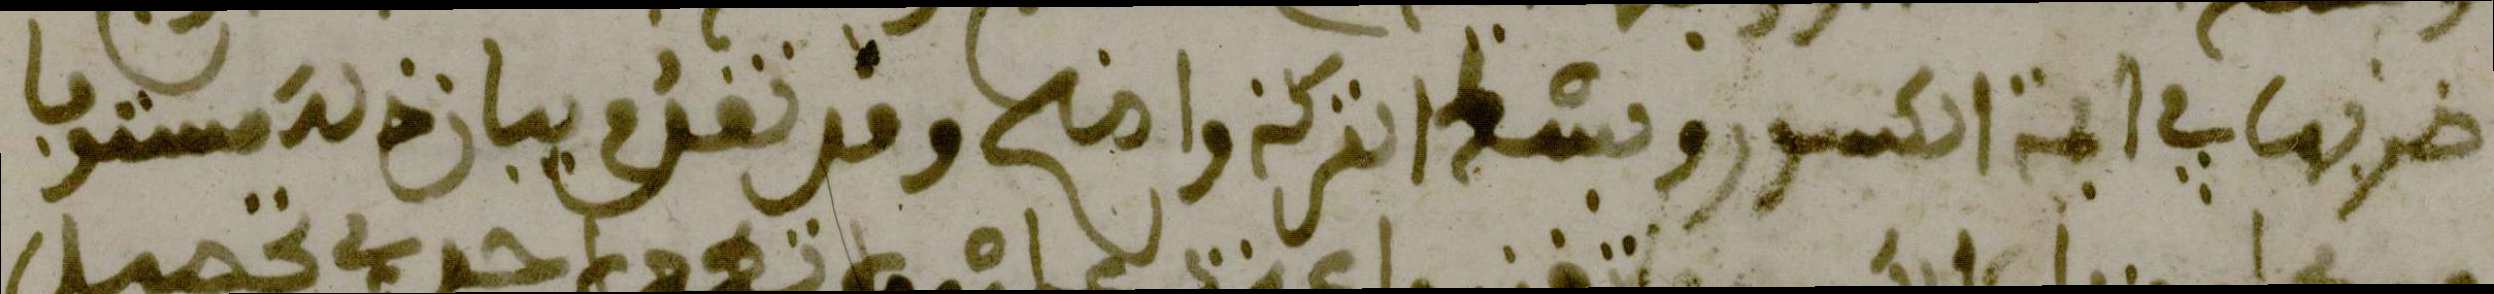ضربها في ايمة الكسور وبْط التركة واضح وقد تقدم بيان ذلك مستوفا
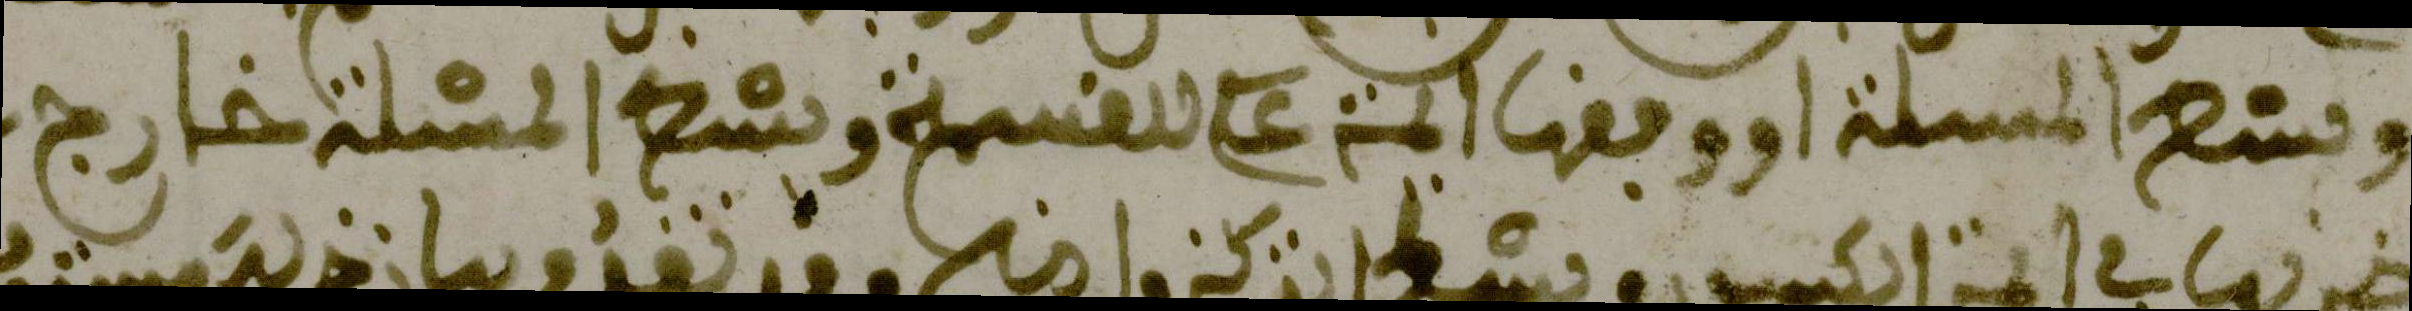وبسْط المسلة او وفقها ايمة على للقسمة وبسْط المسْلة خارج
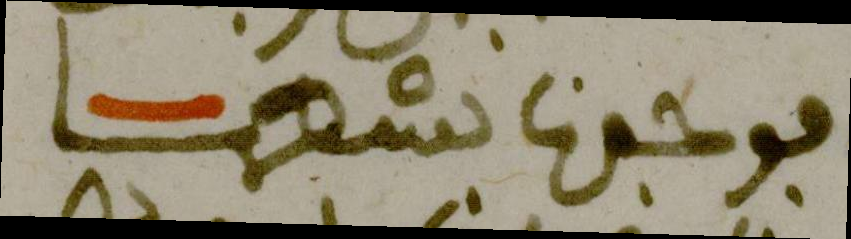فوجدنا بسْطهَا
